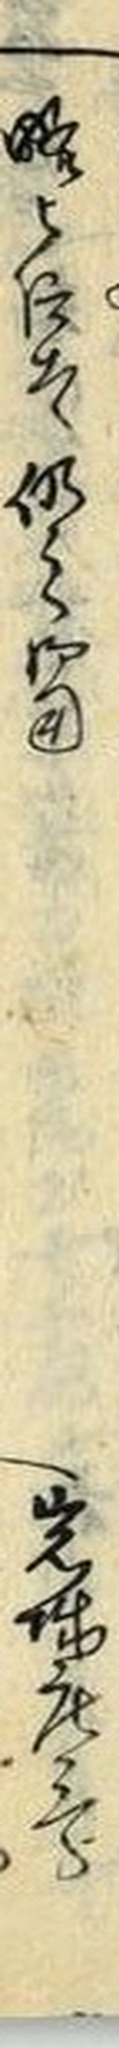略被仰出候仍之御用岩城庄三郎
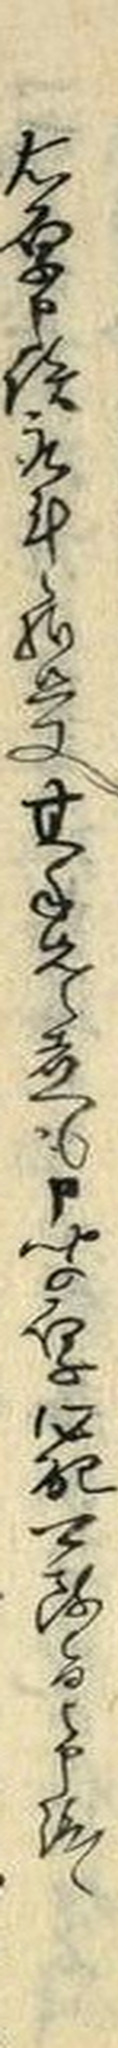右厚申談取斗候様且又其手先之方へも申聞厚心配可致旨被申渡候
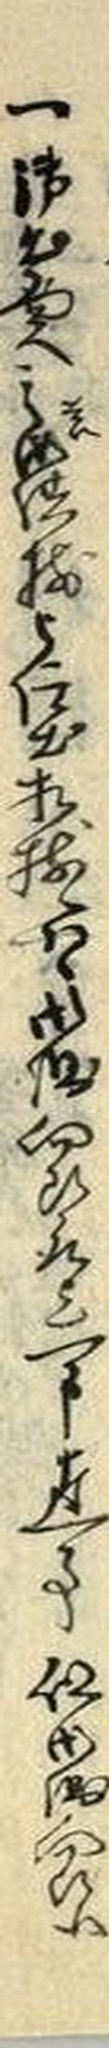一御出殿之節御供揃被仰出相揃候ハゝ御側向頭取迄可申達事但御側向頭取
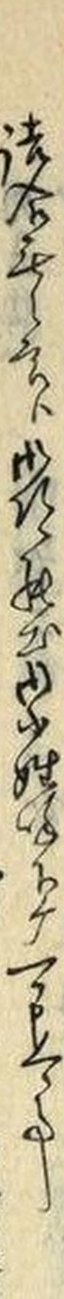詰合無之節ハ御次へ罷出御小姓呼下ヶ可申上候事
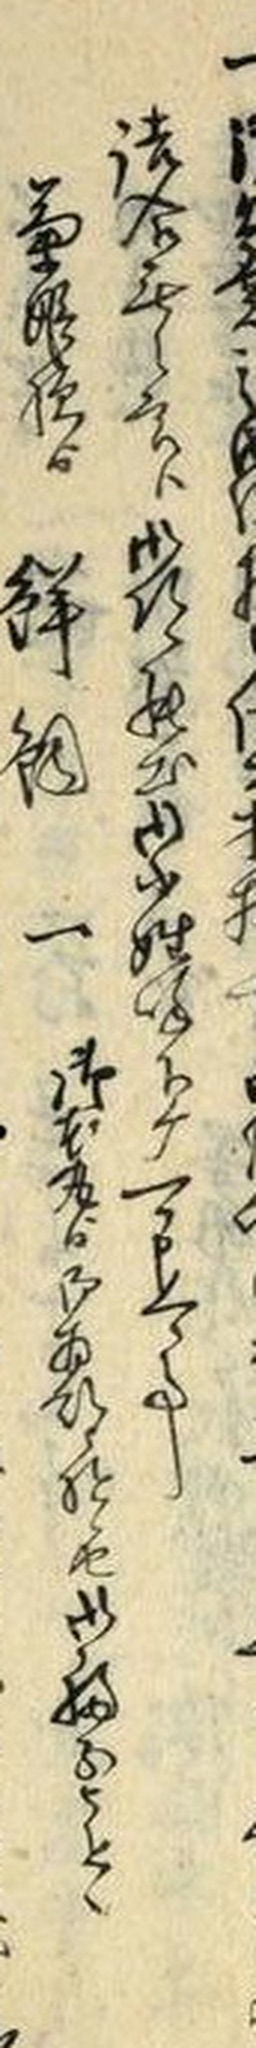菊姫様ゟ鮮鯛一御本丸ゟ御拝領被遊候由御福分被進之
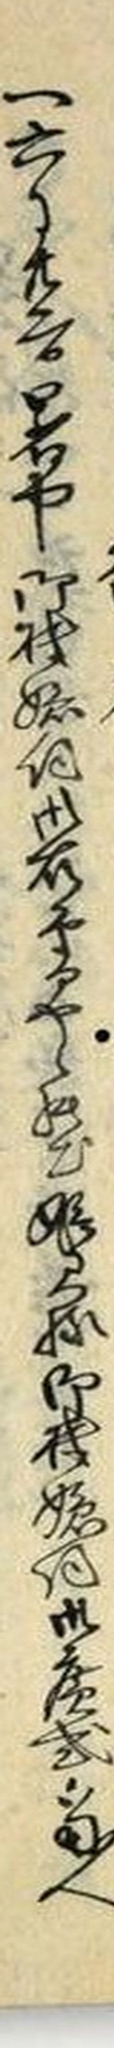一六月廿二日暑中御機嫌伺御右筆部やへ罷出姫君様御機嫌伺御広式御用人
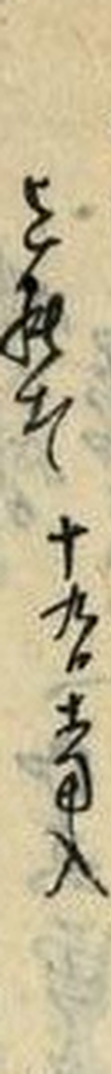迄罷出候十九日土用入

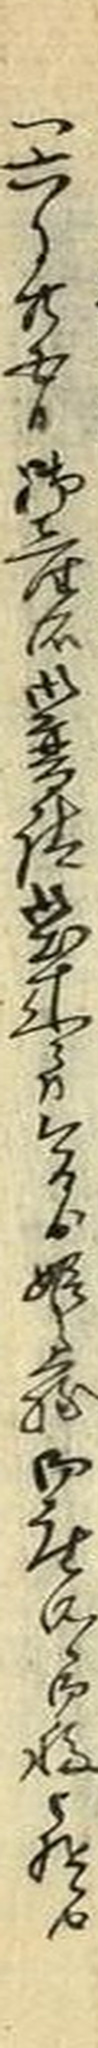一六月廿五日御座所御普請御出来候ニ付今日ゟ姫君様御座所ニ御移被遊候由
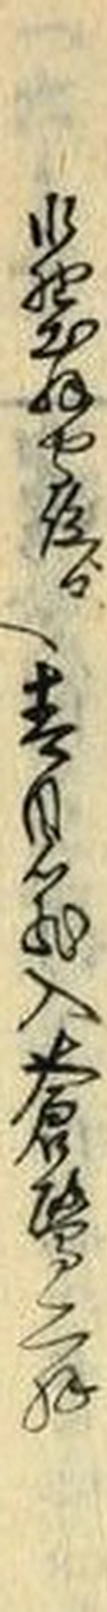水野出羽守殿ゟ青目籠入蒼鷺二羽
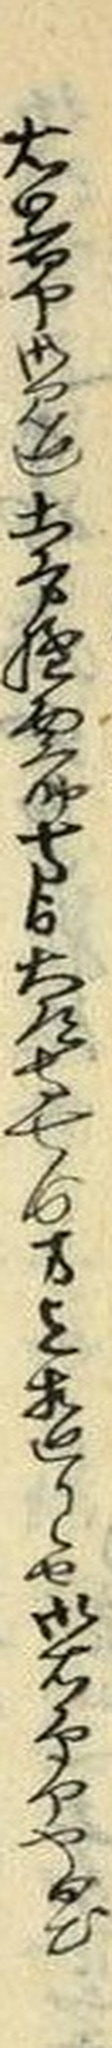右暑中御見廻土方縫殿助方ゟ大道寺七右衛門方迄相廻り候由御右筆部やゟ出
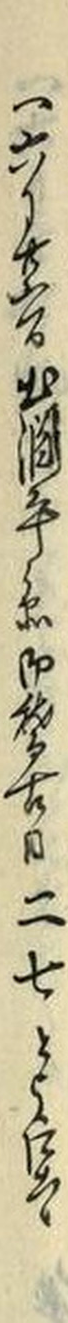一六月廿六日出渕平兵衛御稽古日二七と被仰出候
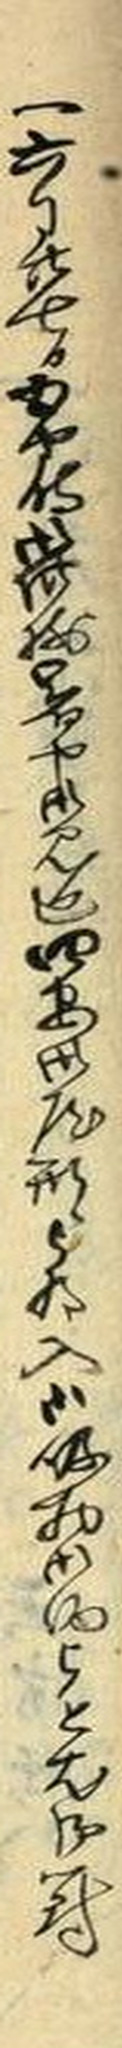一六月廿七日五半時御供揃暑中御見廻田安御屋形へ被為入御吸物御酒被進尤御対
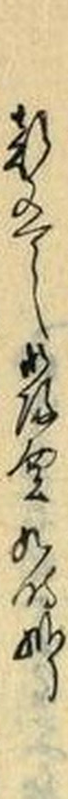顔有之御帰殿九時掛り
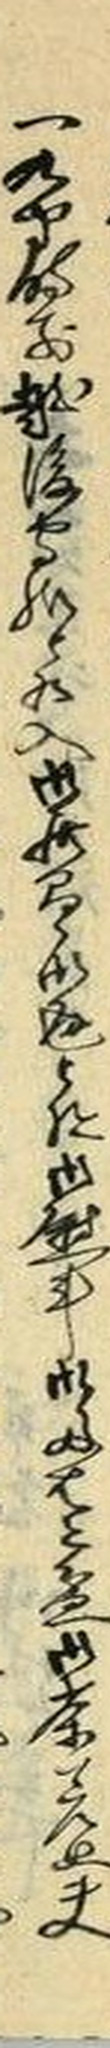一九半時前越後守様被為入御居間御通被遊御熨斗御たばこ盆御茶差上夫
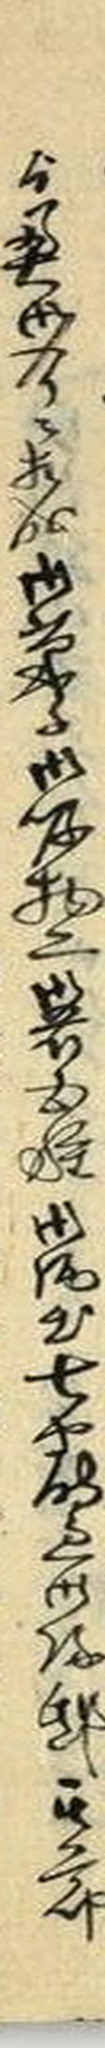ゟ奥御入りニ相成御菓子御吸物二御肴五種御酒出七半時過御帰邸其節
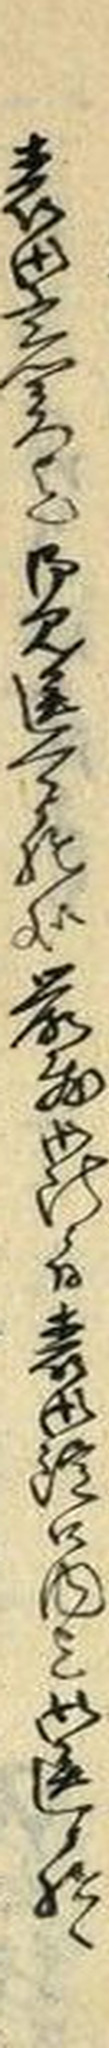表御玄関迄御見送可被遊候処厳敷御断ニ付表御錠口内迄御送被遊候
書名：少傅日録抄（斉承付側向頭取日記、在府）
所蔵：福井県文書館 Fukui Prefectural Archives
